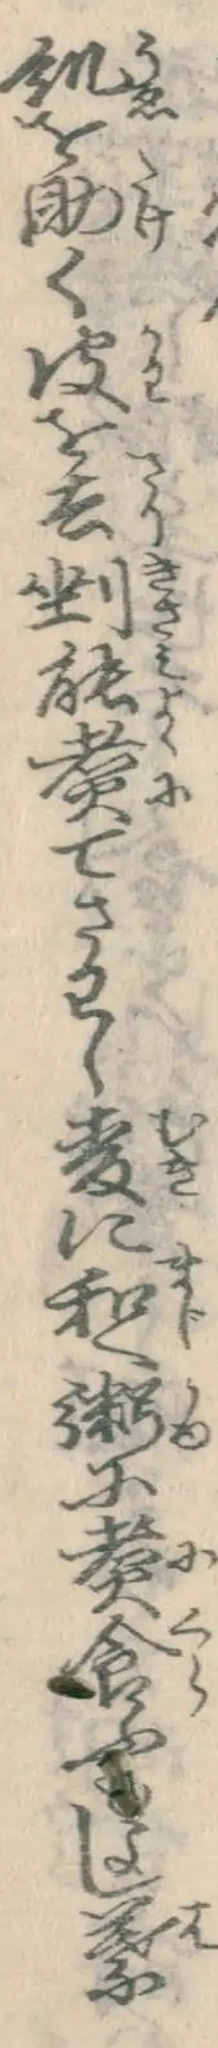飢を助く皮を去剉能煑てさわし麦に和へ粥に煑食ふもよし葉

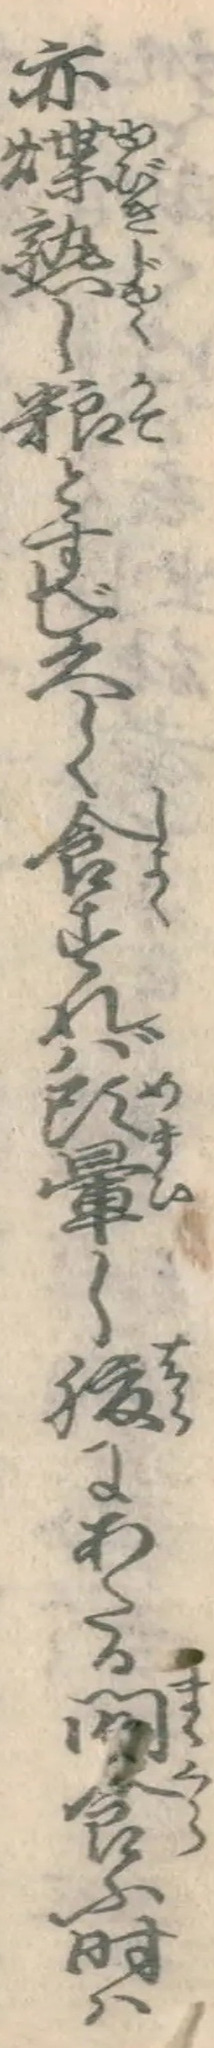亦煠熟し糧とすべし久しく食すれば頭暈し腹にあたる間食ふ時は
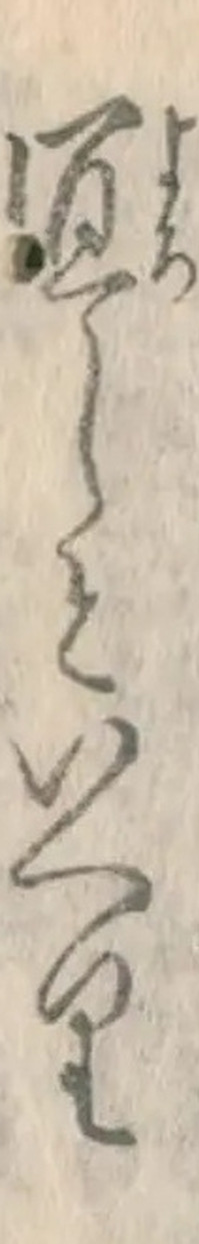宜しといへり
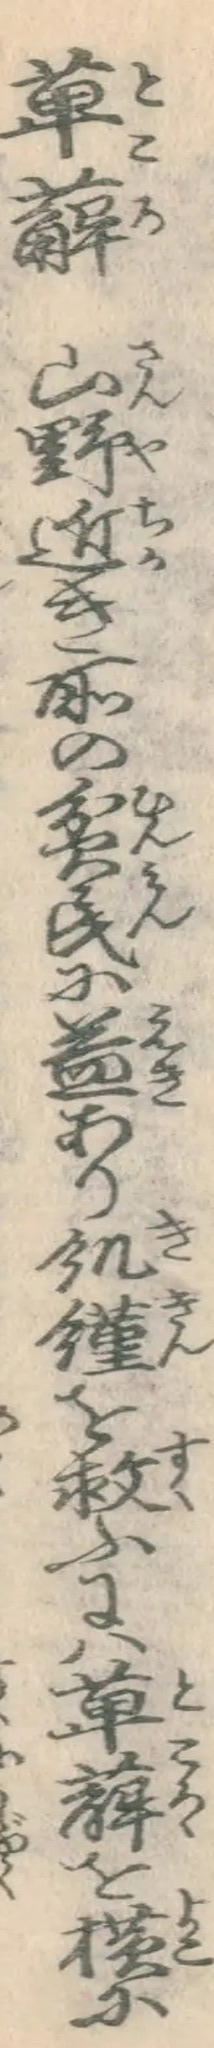萆薢山野近き所の貧民に益あり飢饉を救ふには萆薢を横に
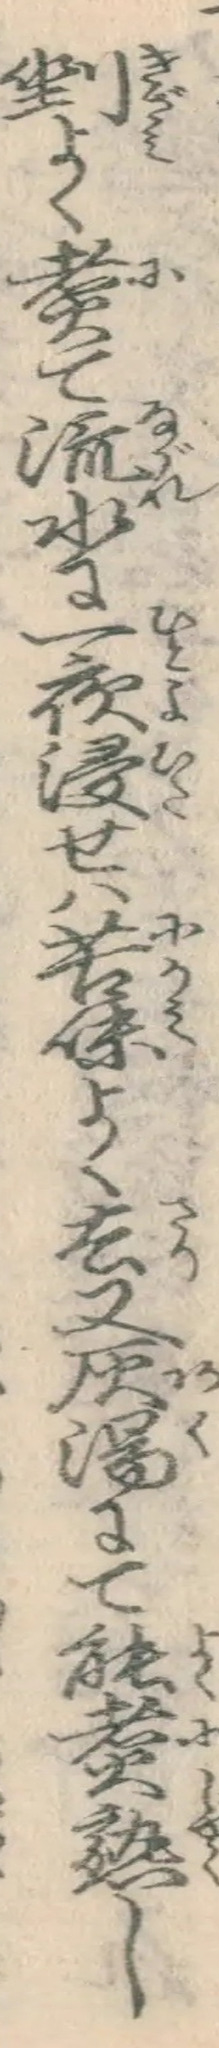剉よく煑て流水に一夜浸せは苦味よく去又灰湯にて能煑熟し
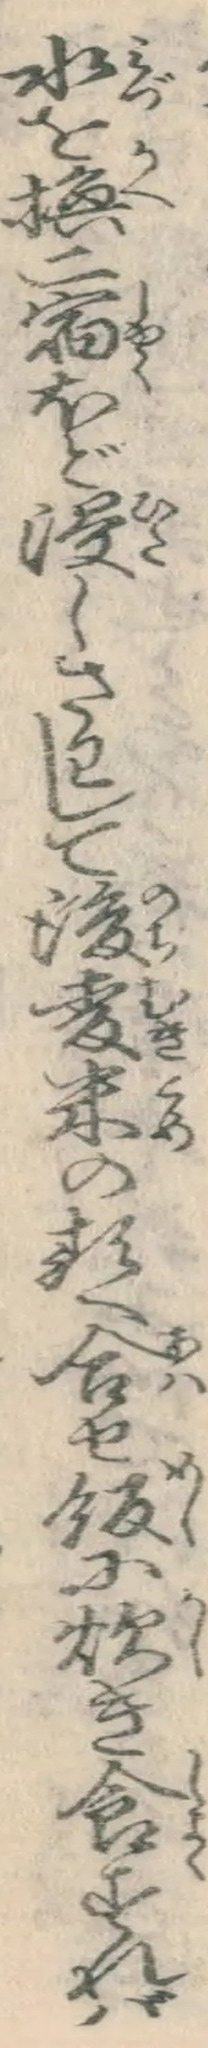水を換二宿ほど浸しさわして後麦米の類へ合せ飯に炊き食すれば
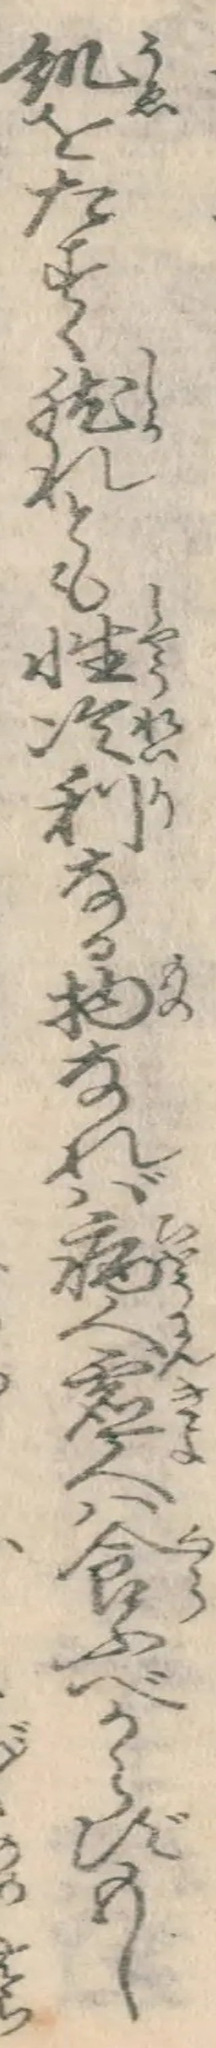飢をたすく然れとも性冷利なる物なれば病人虚人は食ふべからずもし
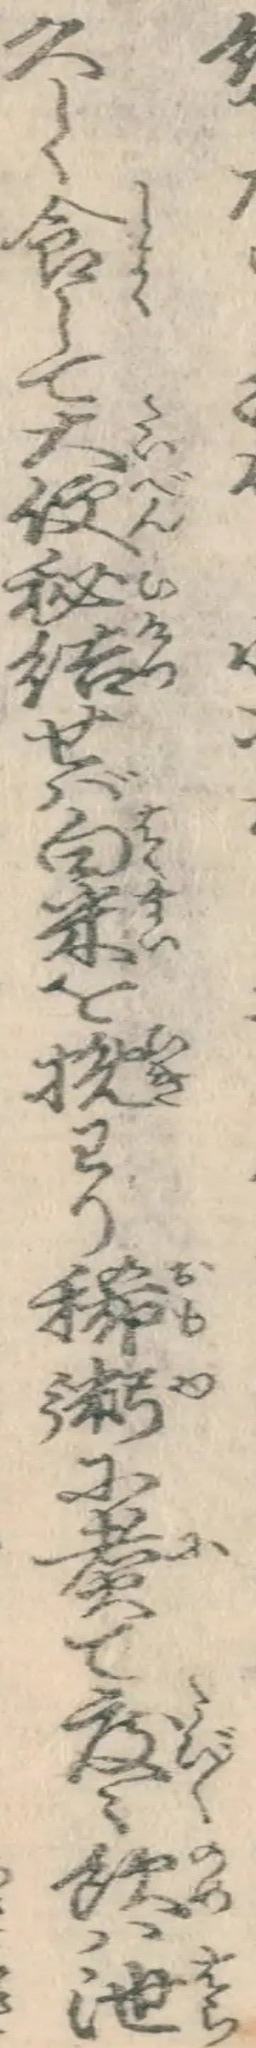久しく食して大便秘結せば白米を挽わり稀粥に煑て度々飲は泄
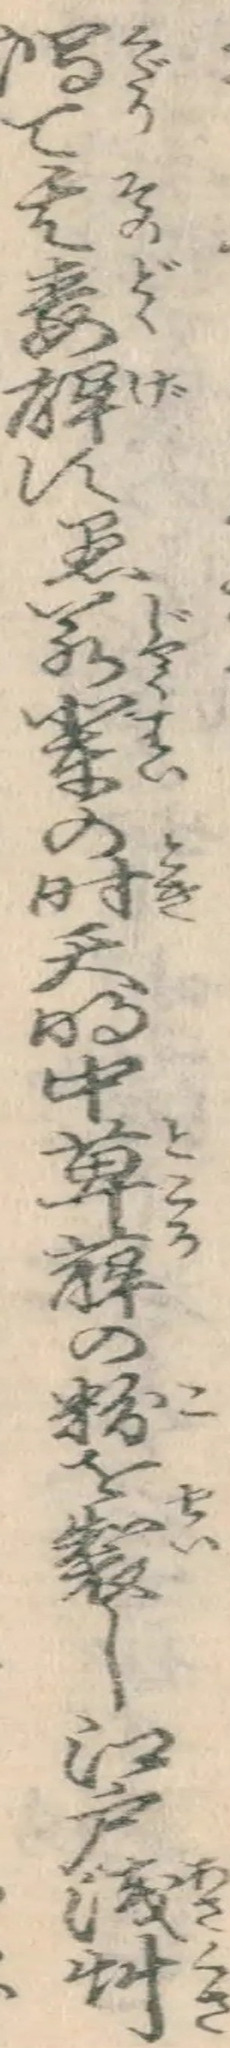瀉て其毒解す愚若軰の時天明中萆薢の粉を製し江戸浅艸
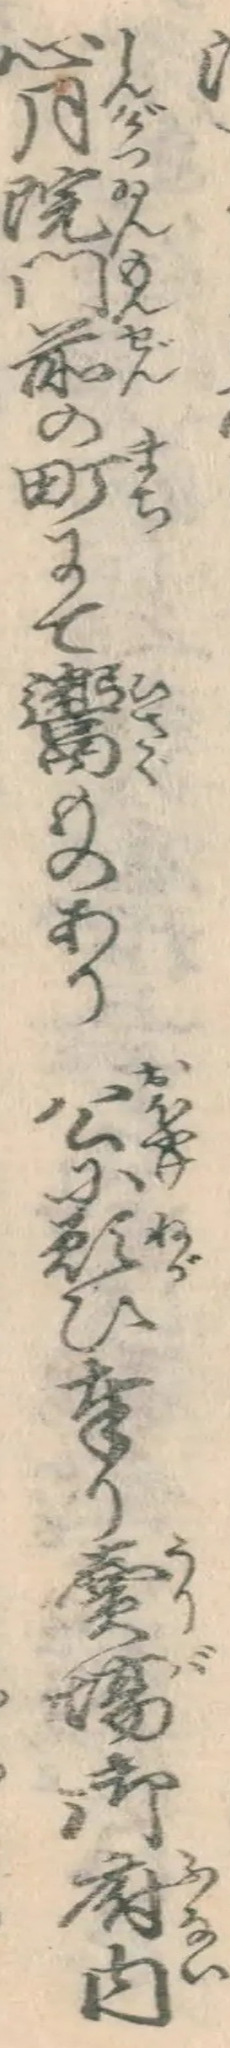心月院門前の町にて鬻ものあり公に願ひ奉り売場御府内
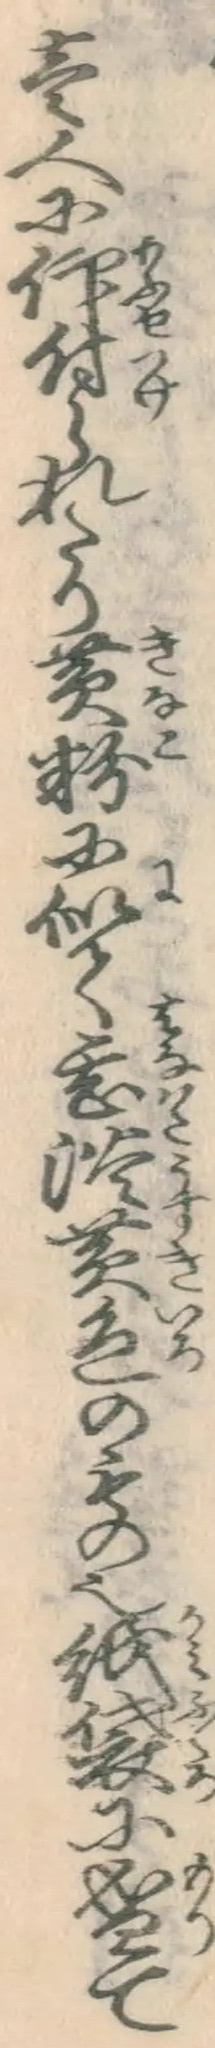壱人に仰付られたり黄粉に似て甚淡黄色のもの也紙袋に盛て
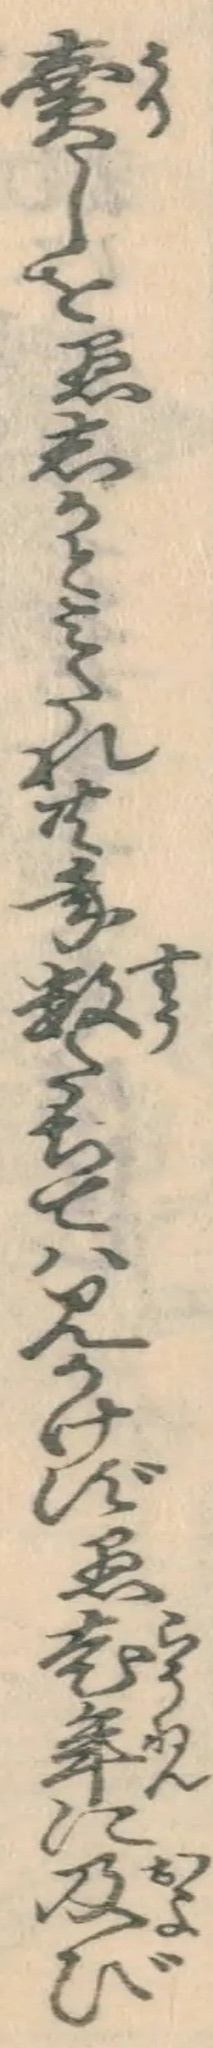売しを愚しかとみたれ共年数たちては見かけず愚老年に及び
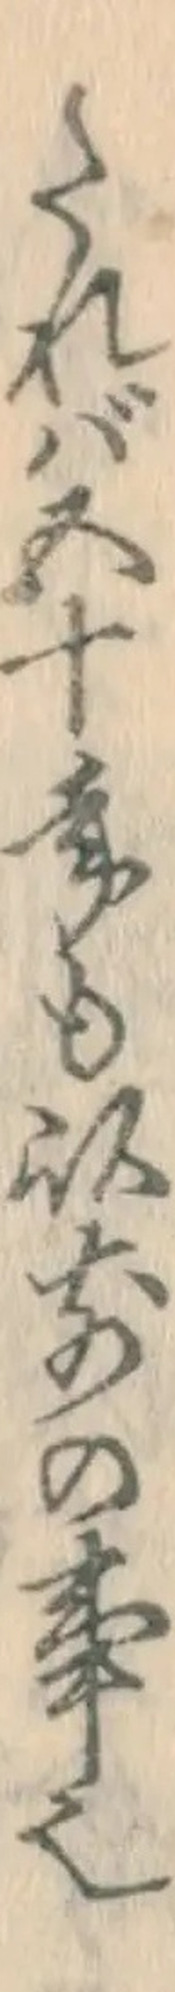たれば五十年も以前の事也
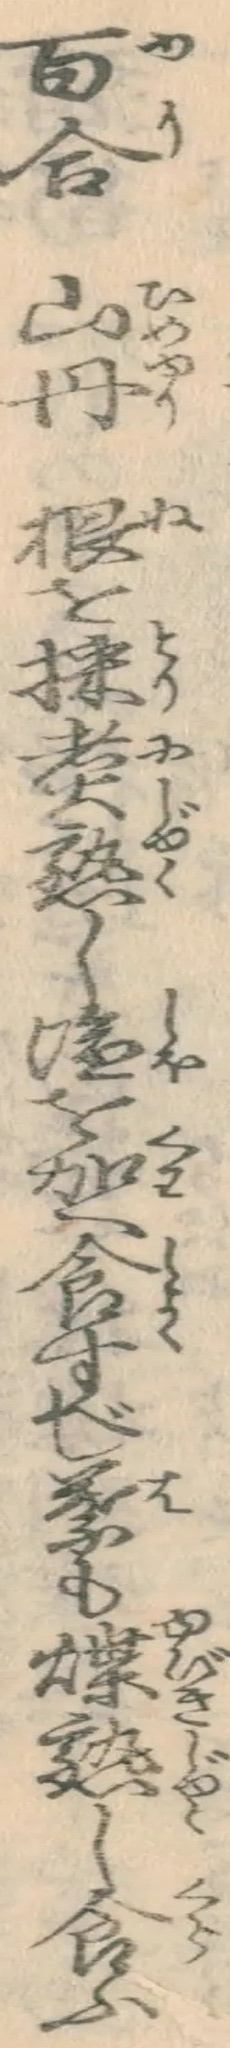百合山丹根を採煑熟し塩を加へ食すべし葉も煠熟し食ふ
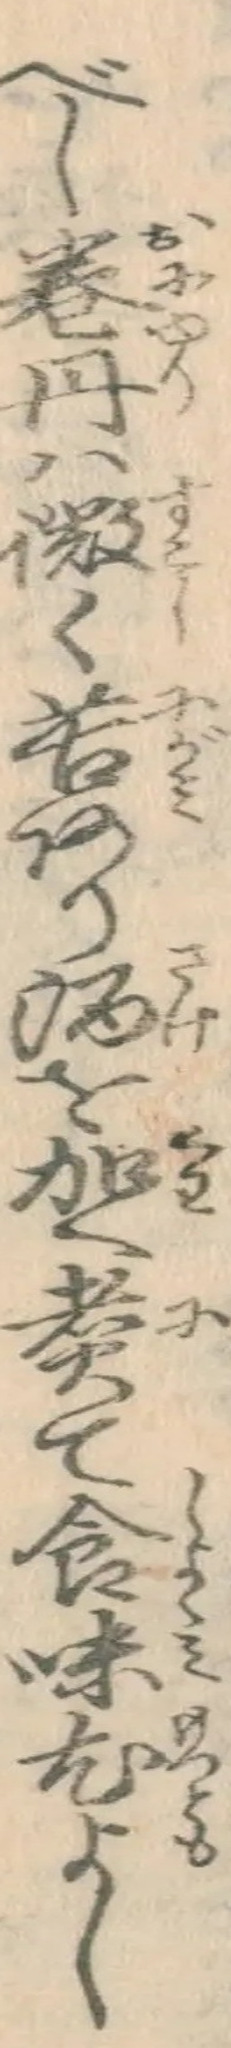べし巻丹は微く苦あり酒を加へ煑て食味尤よし
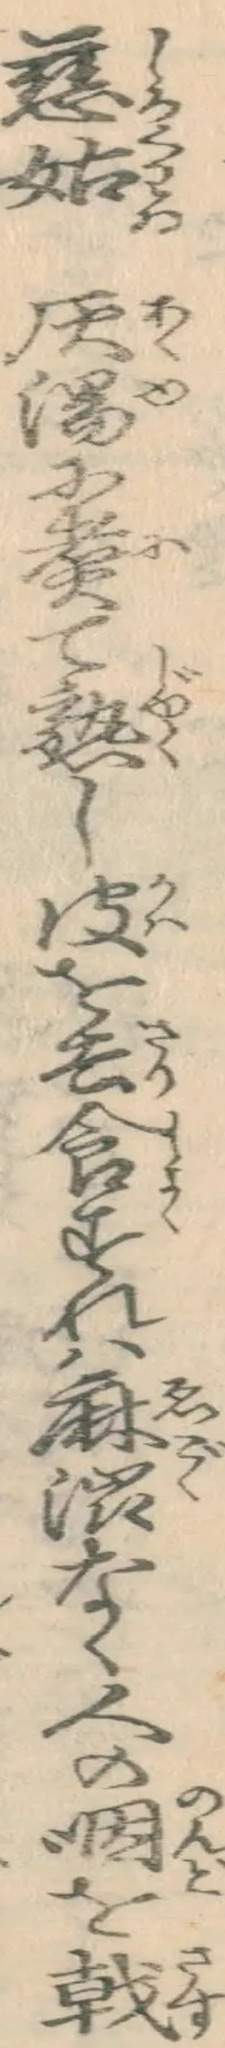慈姑灰湯に煑て熟し皮を去食すれは麻渋なく人の咽を戟
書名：経済をしへ草
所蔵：国立国会図書館 National Diet Library, JAPAN
